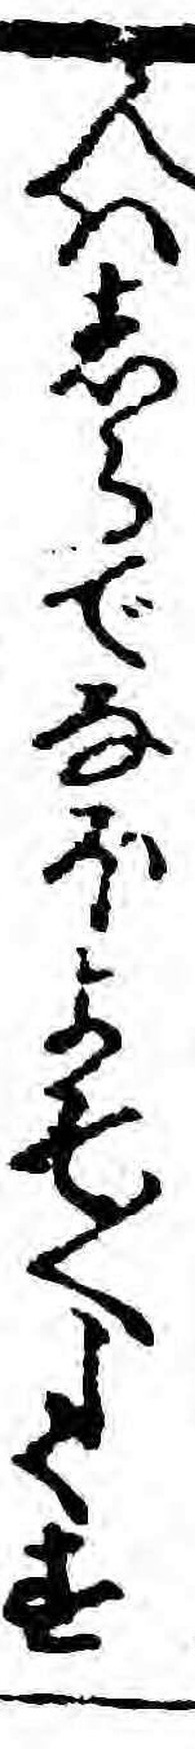人はしらでなほよそ〳〵しくす
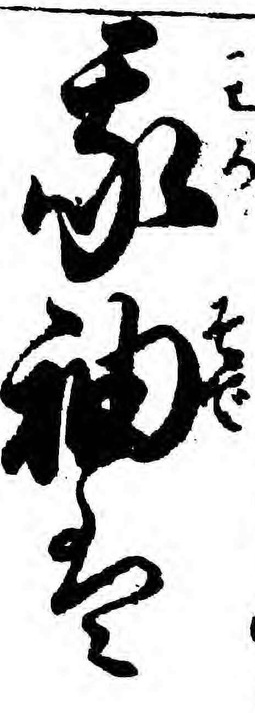我袖は
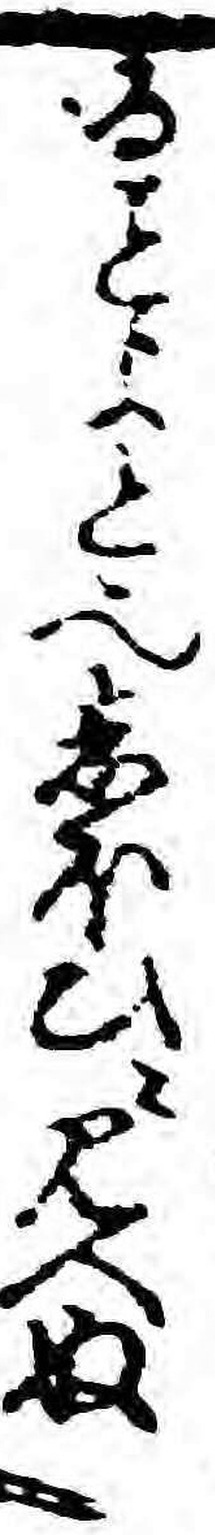ることよと也しほひに見へぬ
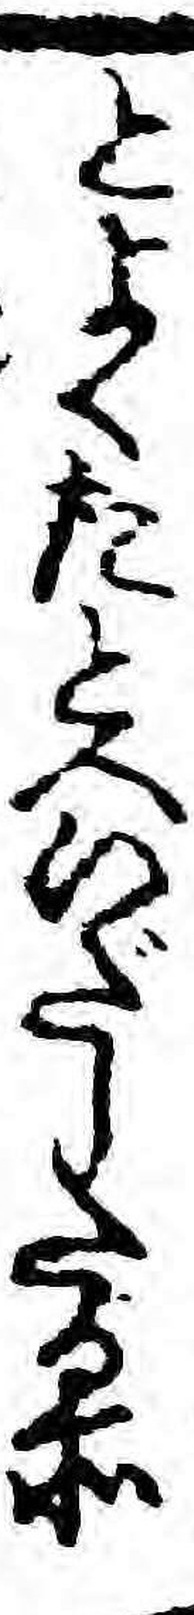とよくたとへいだしたる所
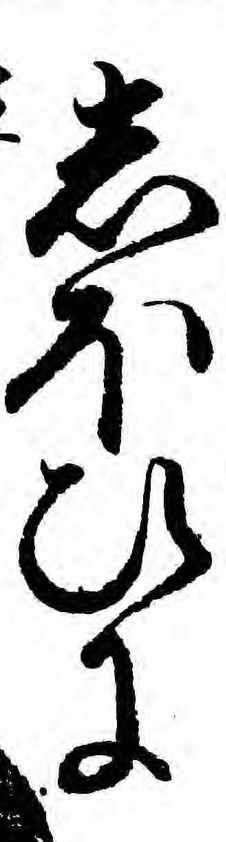しほひに
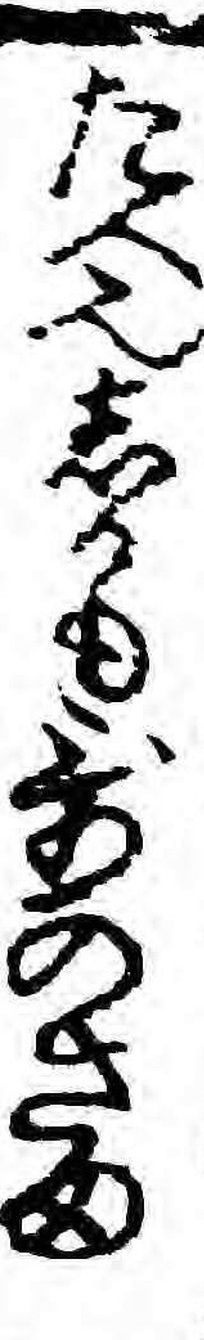たへ也しかも哥のさま
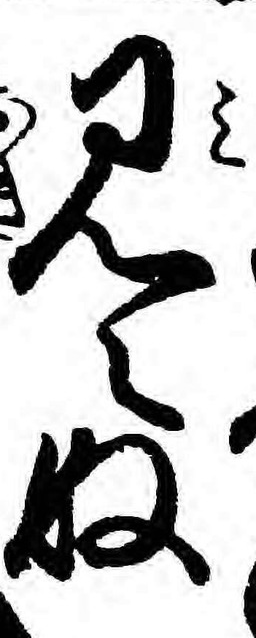見えぬ
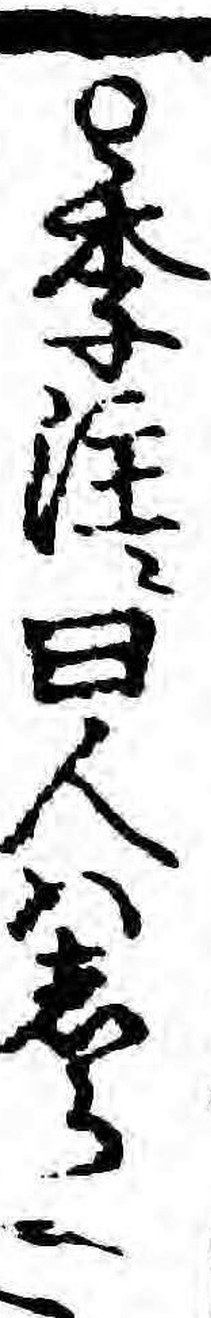〇季注に曰人はしら
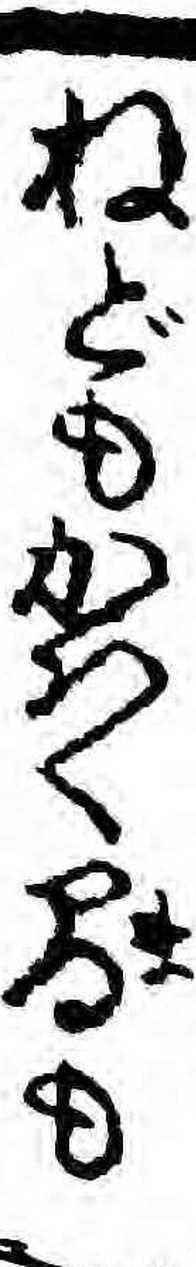ねどもかはく間も
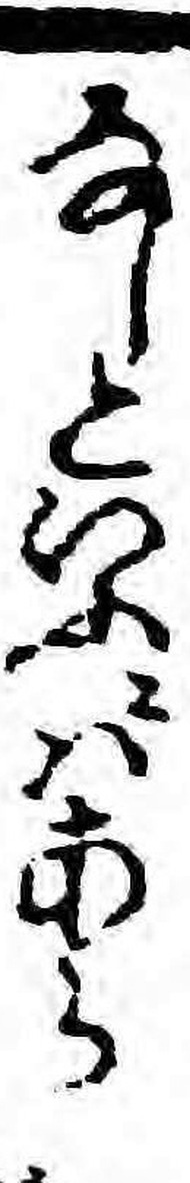なしといふにはあら
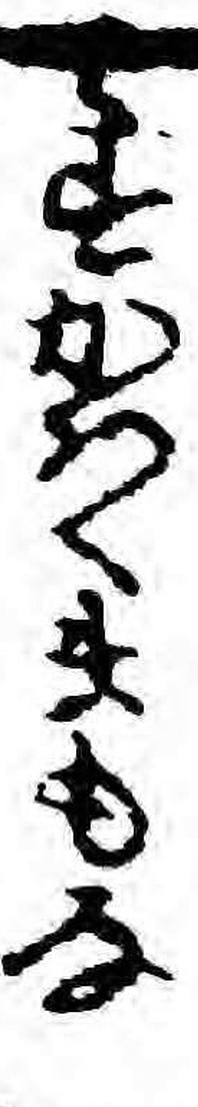ずかはくまもな
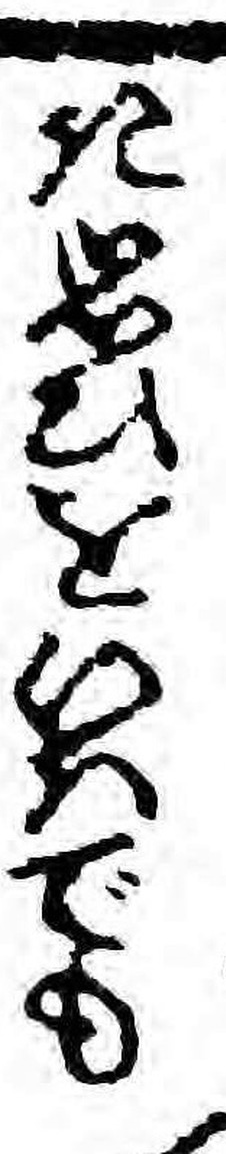き思ひをいはでも
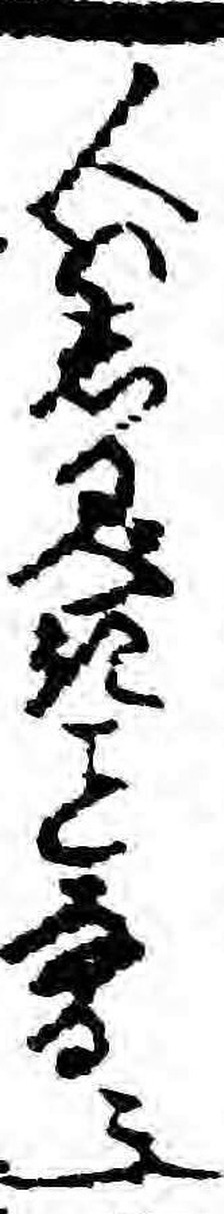人はしるべきことなるに
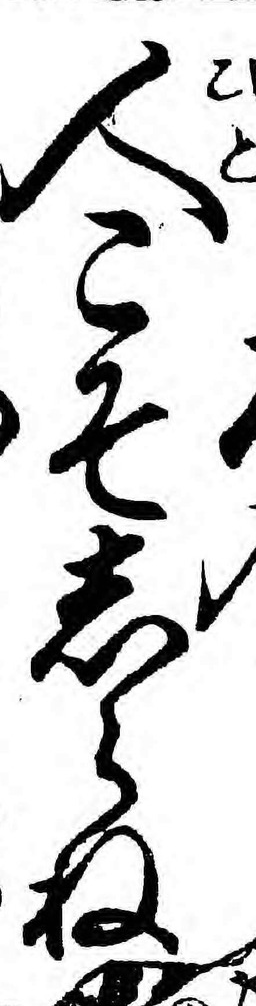人こそしらね
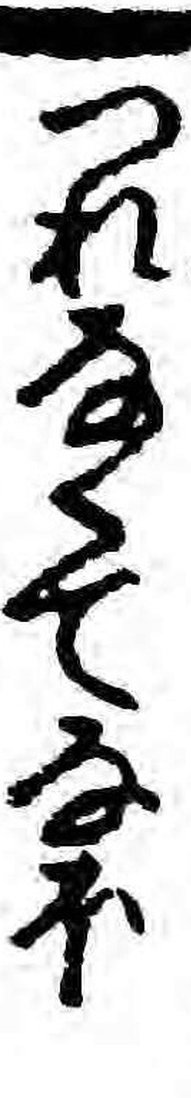つれなくてなほ
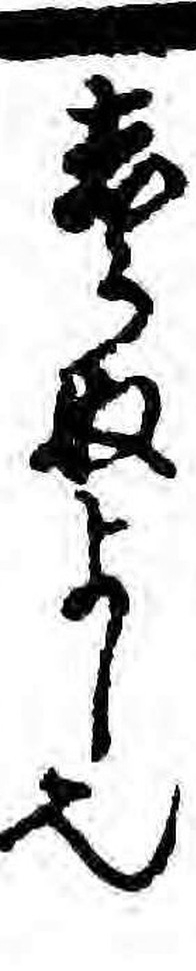しらぬよし也
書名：頭書和歌注譯／壽賀多百人一首小倉錦
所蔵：国文学研究資料館
